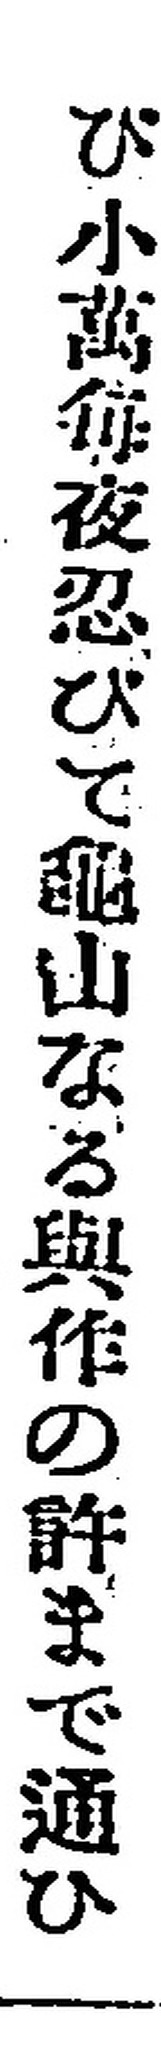び小万毎夜忍びて亀山なる与作の許まで通ひ
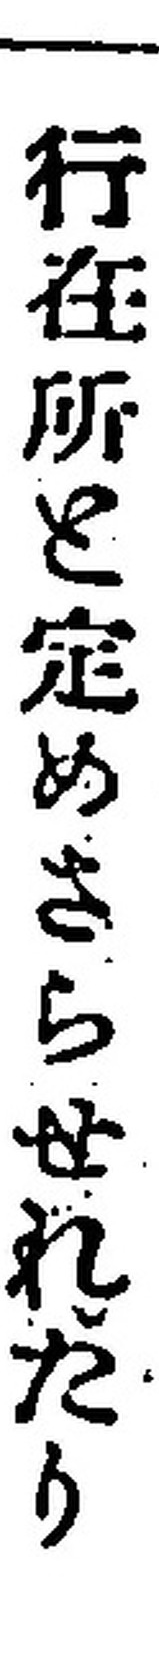行在所と定めさらせれたり
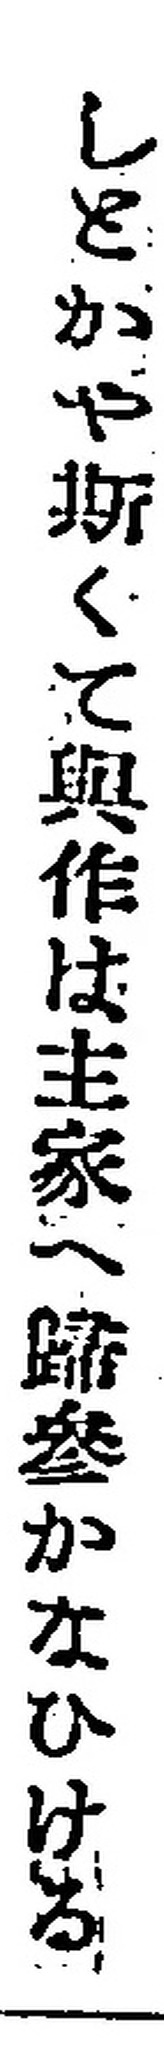しとかや斯くて与作は主家へ帰参かなひける
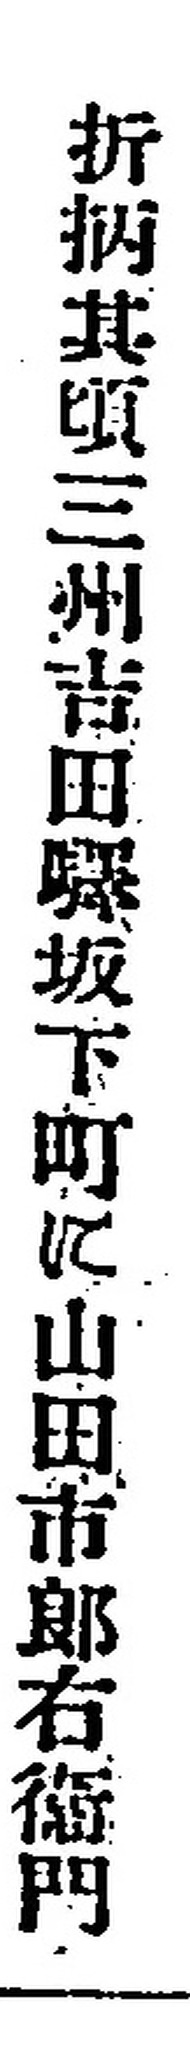折抦其頃三州吉田駅坂下町に山田市郎右衛門
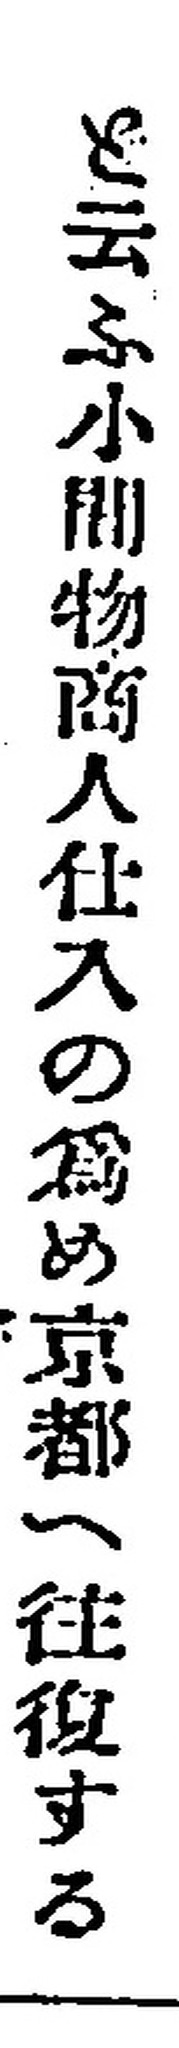と云ふ小間物商人仕入の為め京都へ往復する
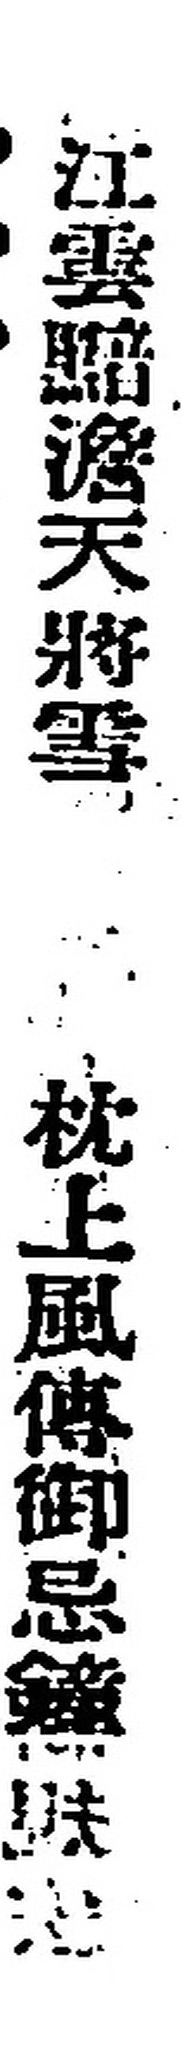江雲黯澹天将雪枕上風伝御忌鐘
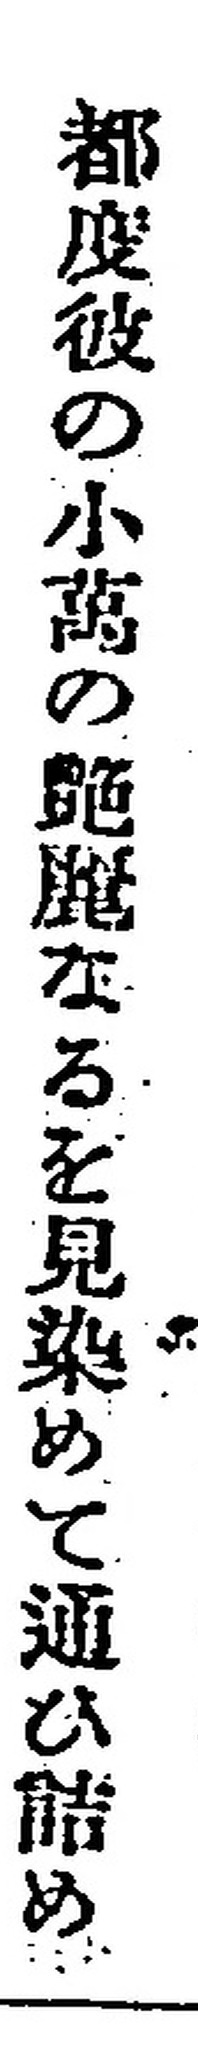都度彼の小万の艶麗なるを見染めて通ひ詰め
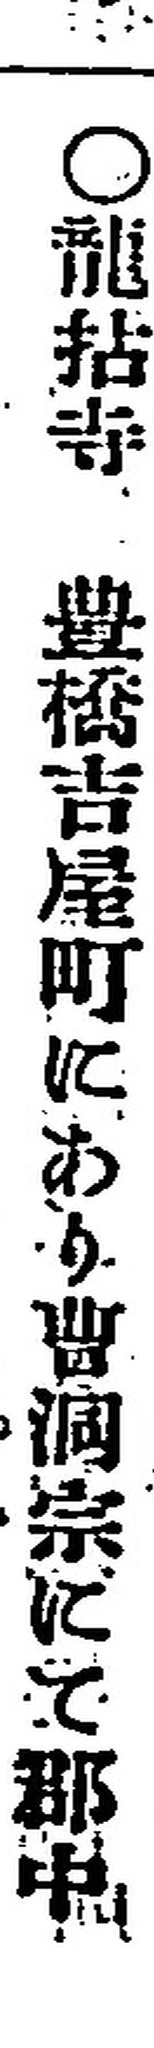○龍拈寺豊橋吉屋町にあり曹洞宗にて郡中
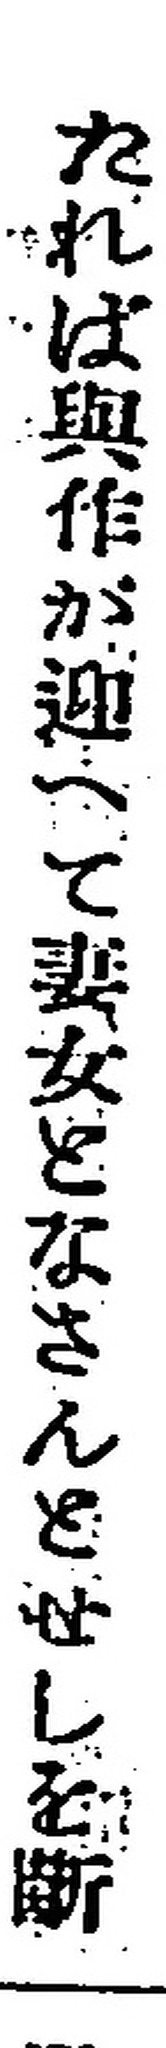たれば与作が迎へて妻女となさんとせしを断
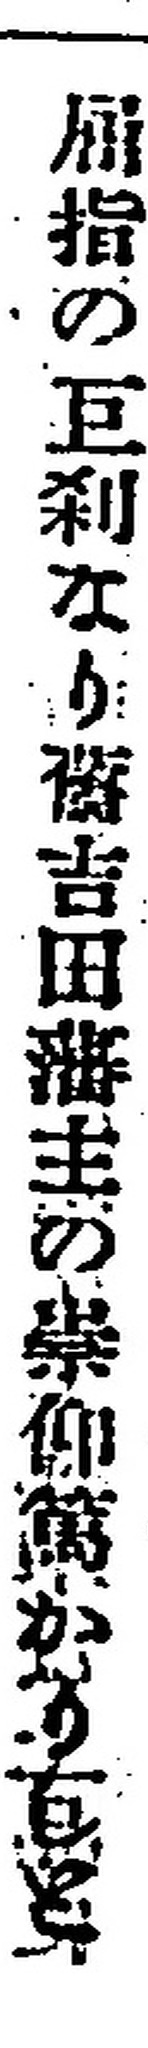屈指の巨刹なり旧吉田藩主の崇仰篤かりしと
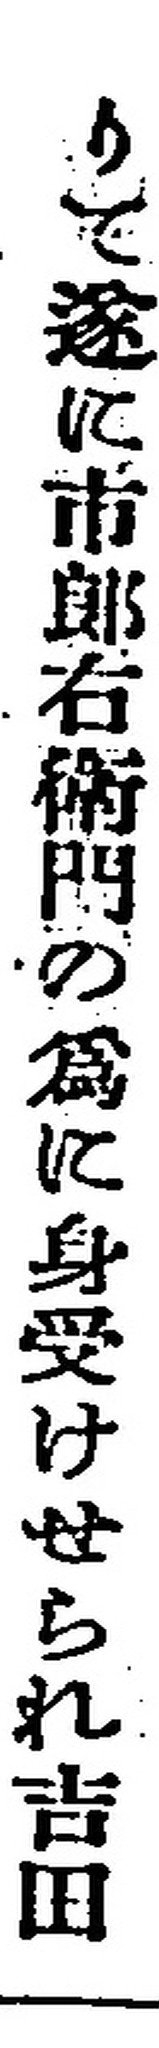りて遂に市郎右衛門の為に身受けせられ吉田
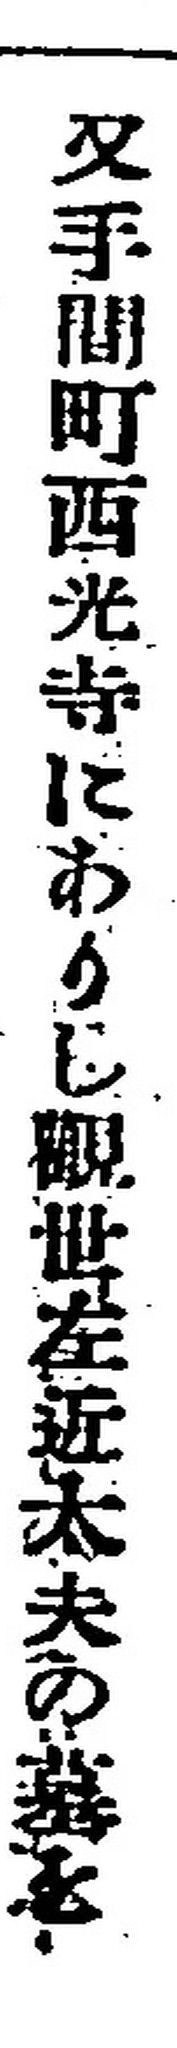又手間町西光寺にありし観世左近太夫の墓を
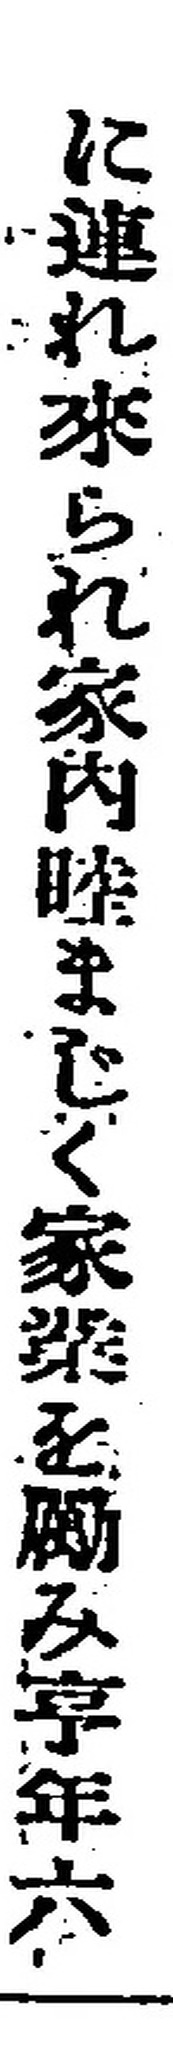に連れ来られ家内睦まじく家業を励み享年六
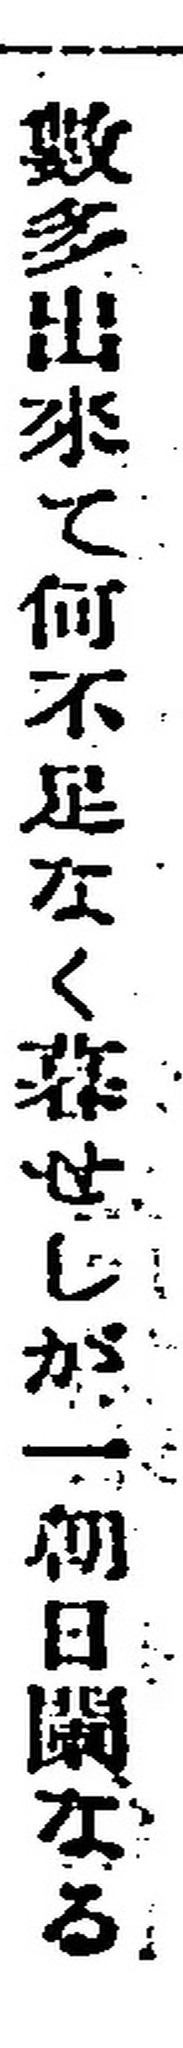数多出来て何不足なく暮せしが一朝日闌なる
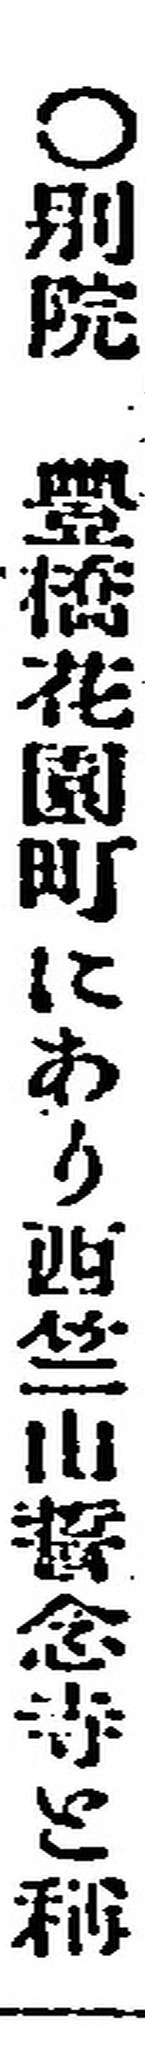○別院豊橋花園町にあり西竺山誓念寺と称
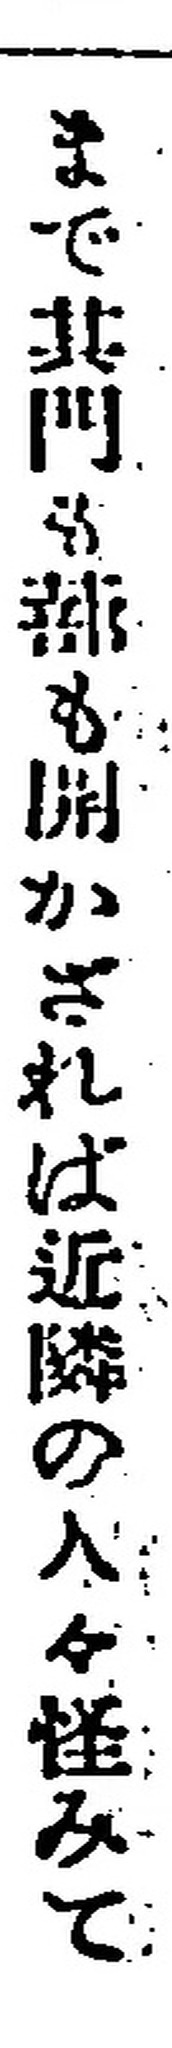まで其門も蔀も開かざれば近隣の人々怪みて
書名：東参名勝案内
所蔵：国立国会図書館 National Diet Library, JAPAN
